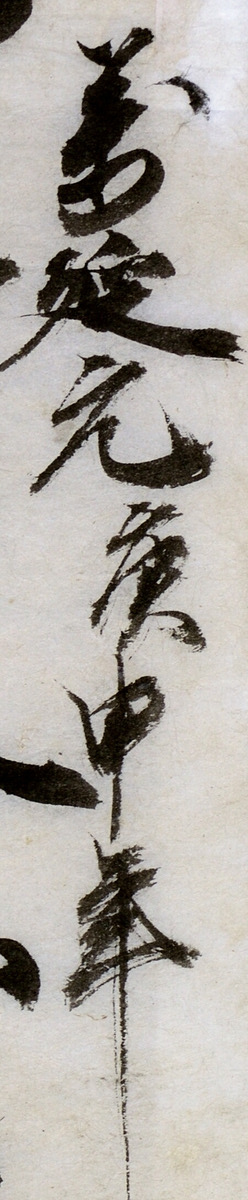万延元庚申年
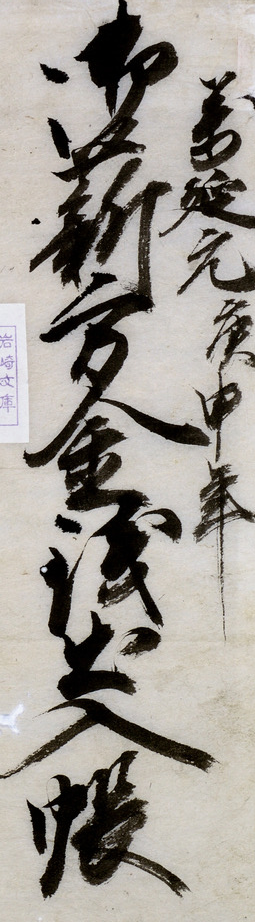御薪方金銭出入帳
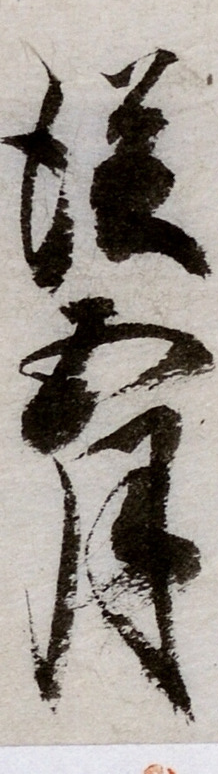従五月
